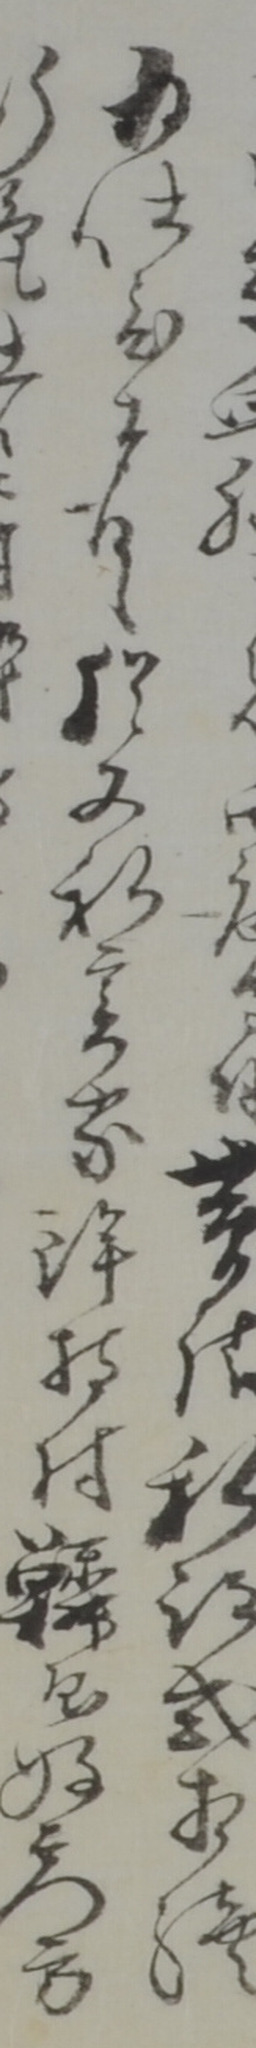為仕度奉存候猶又私実家鉾持村鱗屋好右衛門方
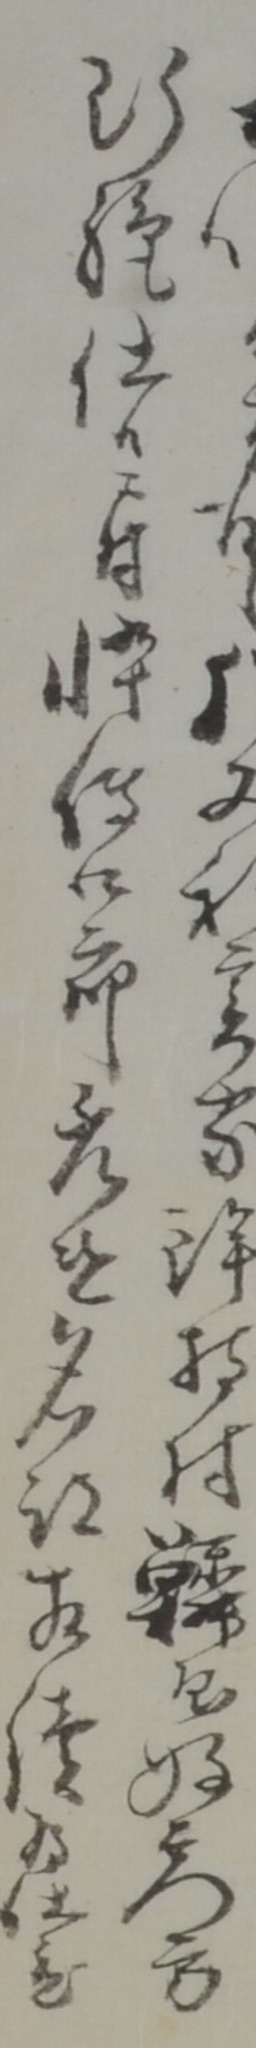断絶仕候ニ付悴伝四郎差遣名跡相続為仕度
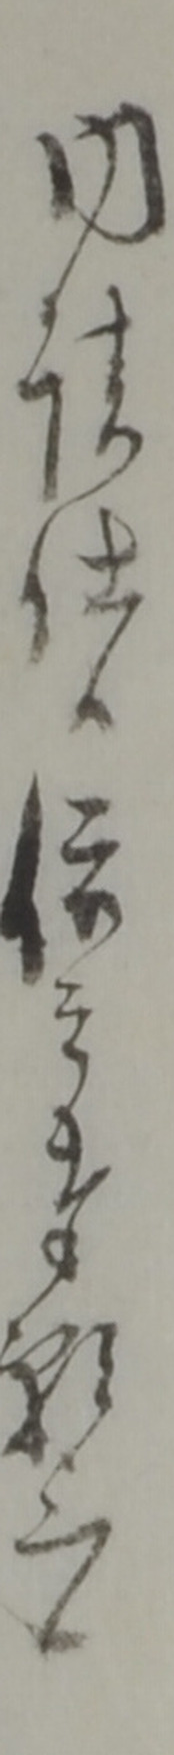内談仕候依之奉願上候
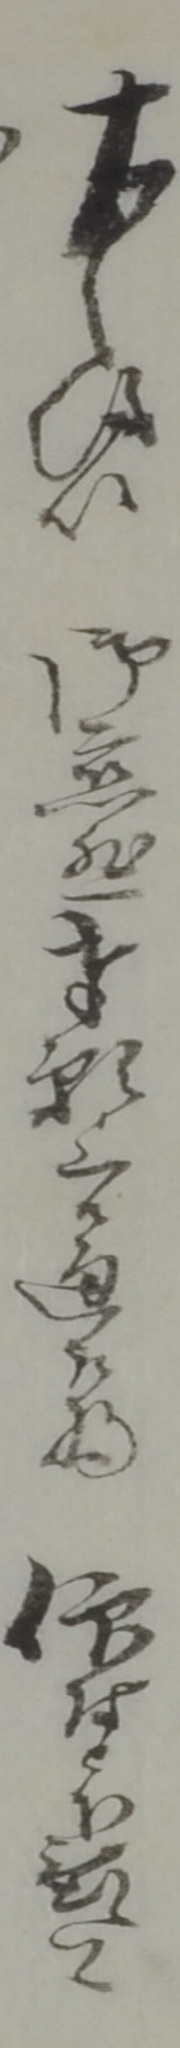右之趣以御慈悲奉願上候通被為仰付被下置候ハヽ
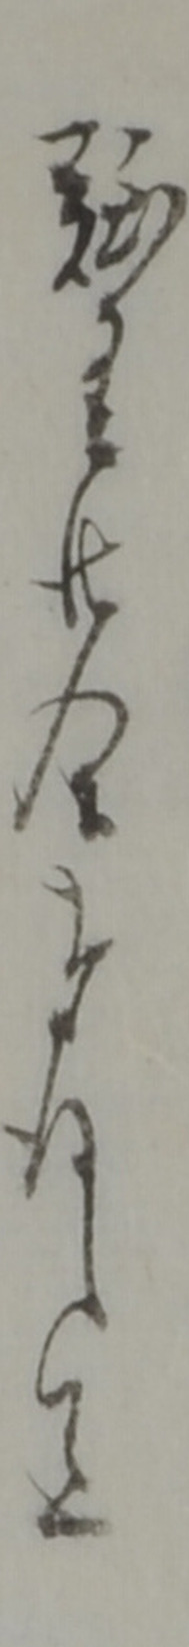難有仕合奉存候以上
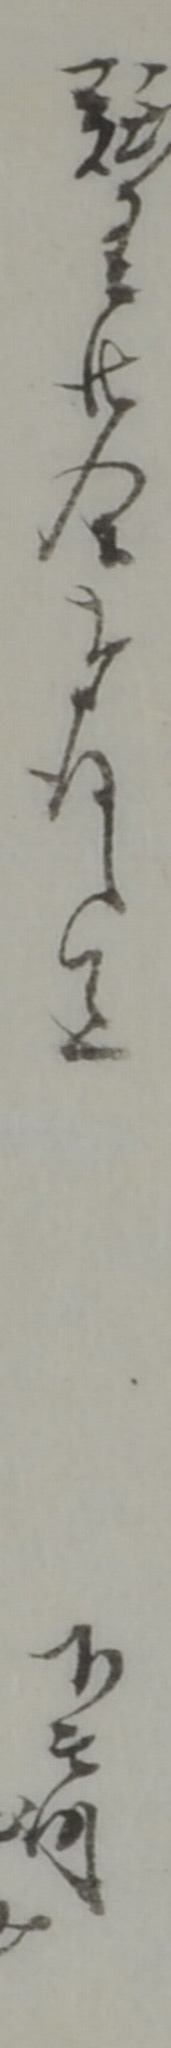難有仕合奉存候以上下モ町
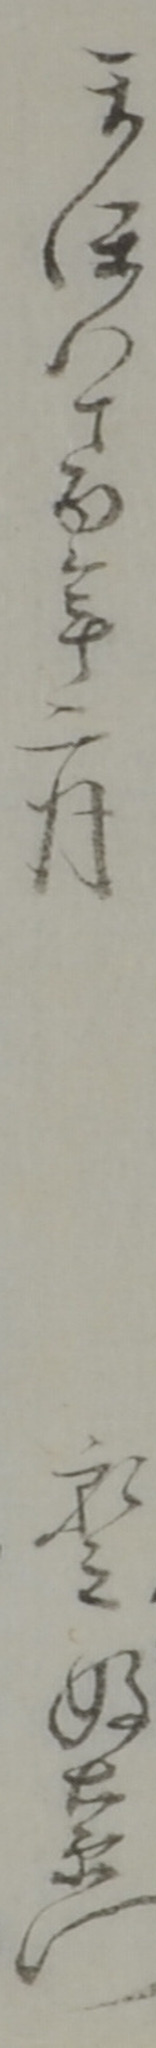天保八丁酉年二月願主好右衛門
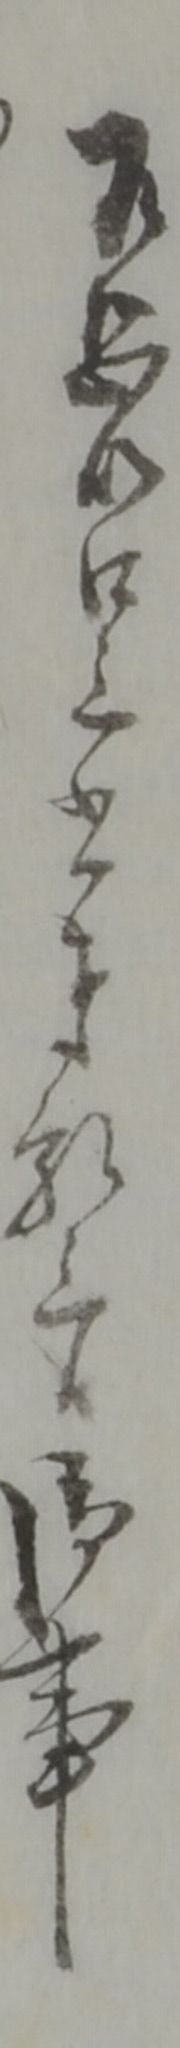乍恐以口上書奉願上候御事
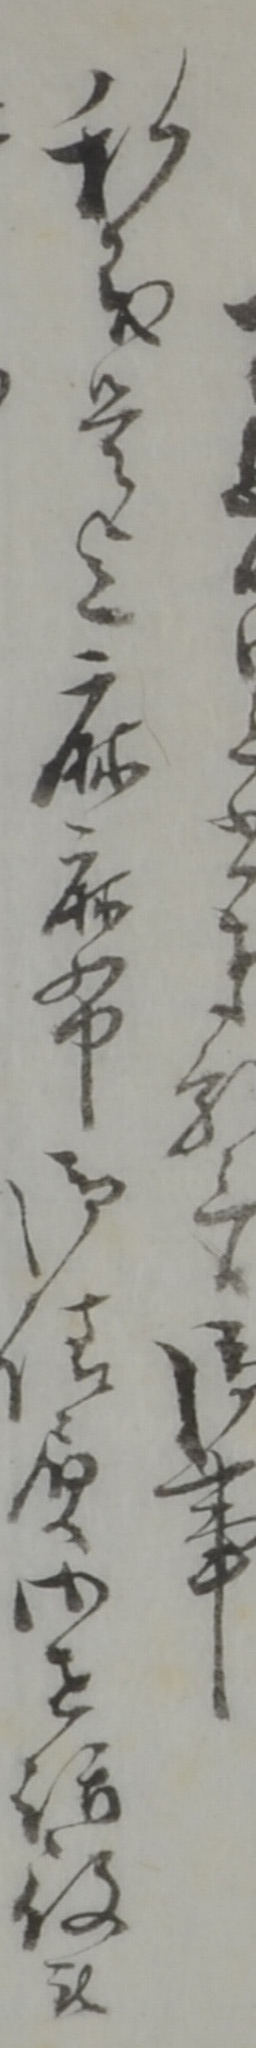私義是迄麻麻布御請負御世話役被
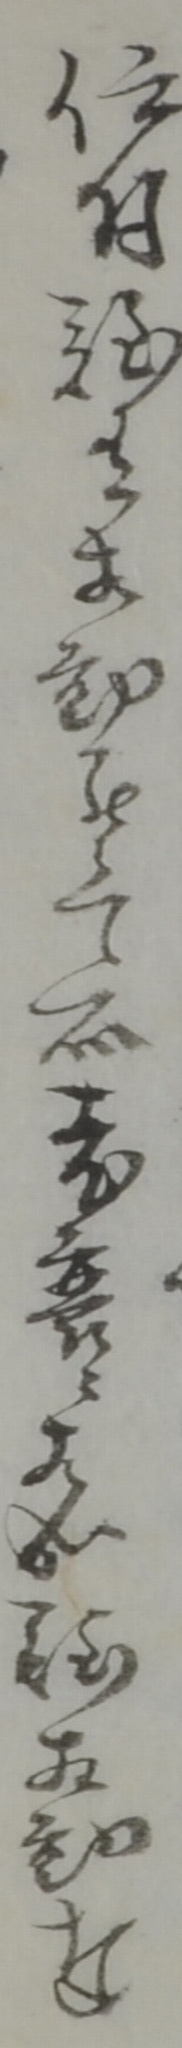仰付難有相勤罷在候所老衰ニ相成難相勤奉
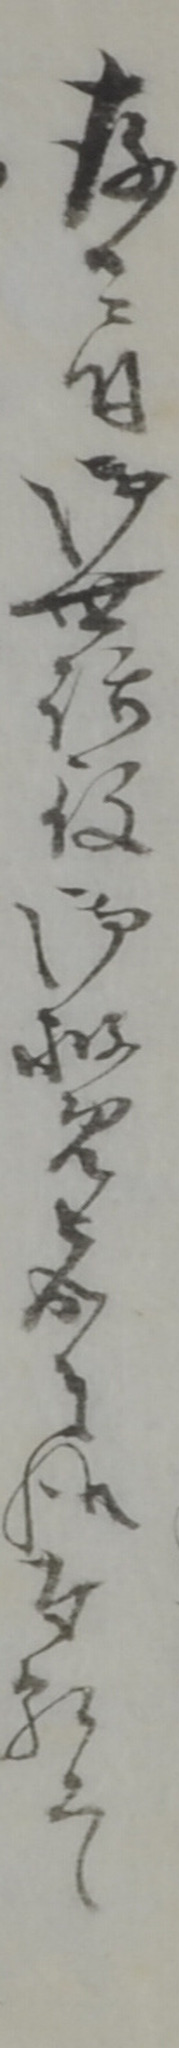存候ニ付御世話役御赦免被成下候様奉願上候
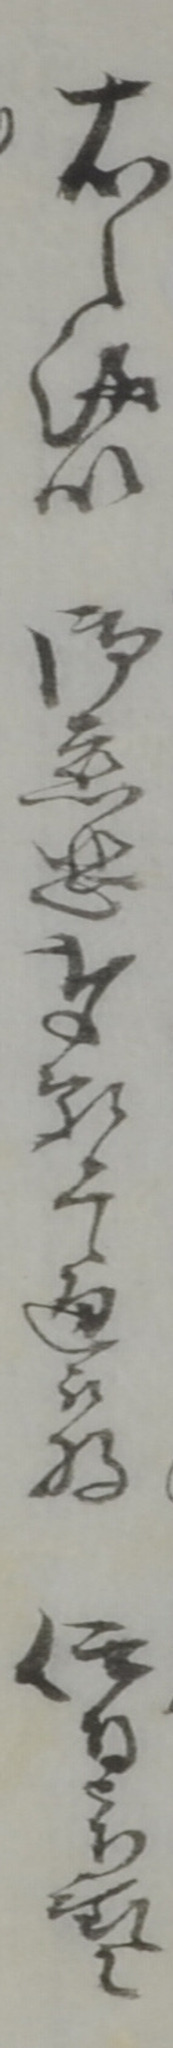右之趣以御慈悲奉願上候通被為仰付被下置候ハヽ
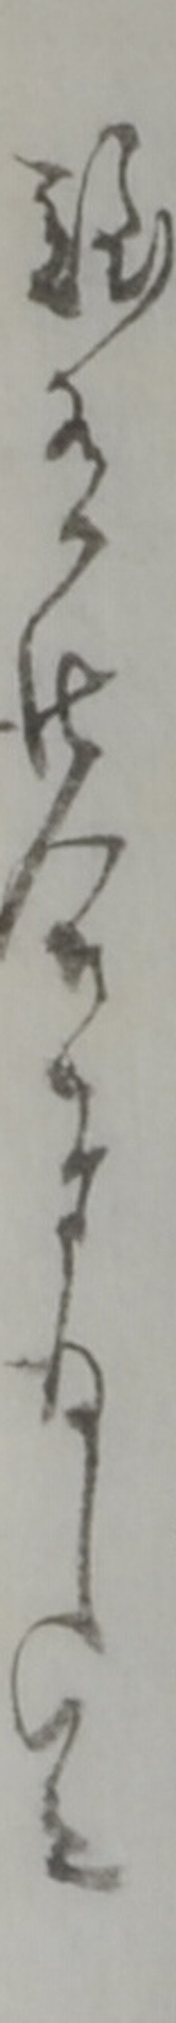難有仕合奉存候以上

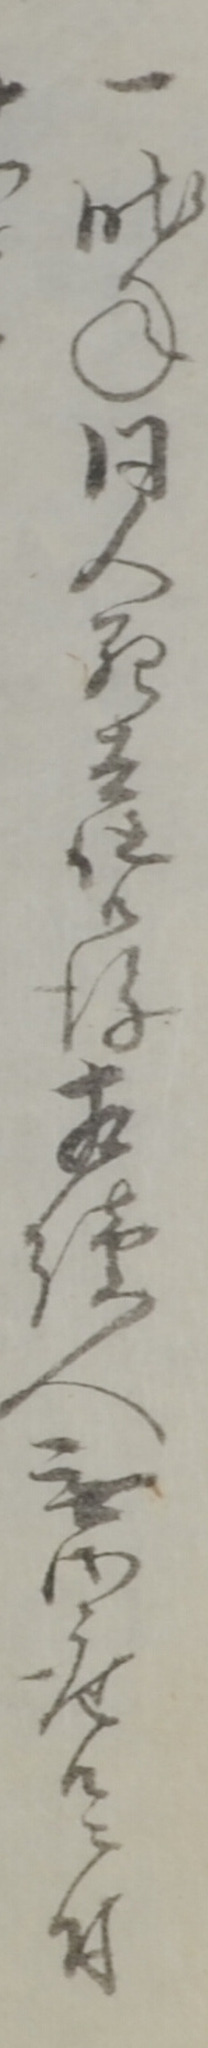一昨年同人死去仕候後相続人無御座候ニ付
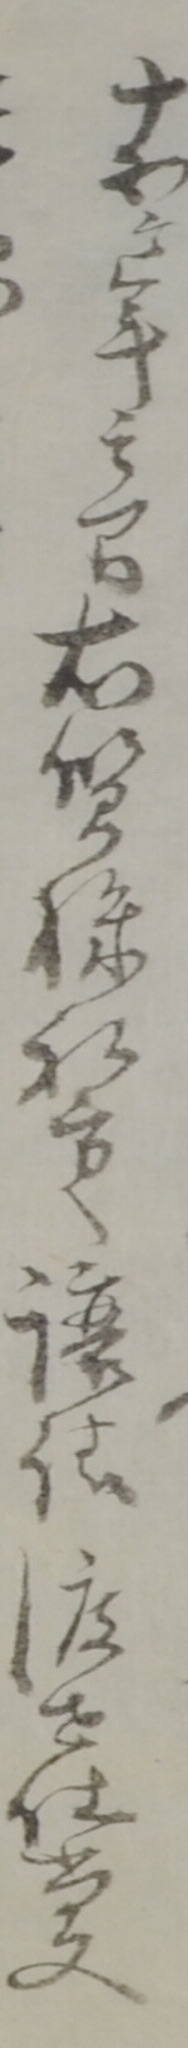十五ケ年之間右質株私方へ譲請渡世仕尚又
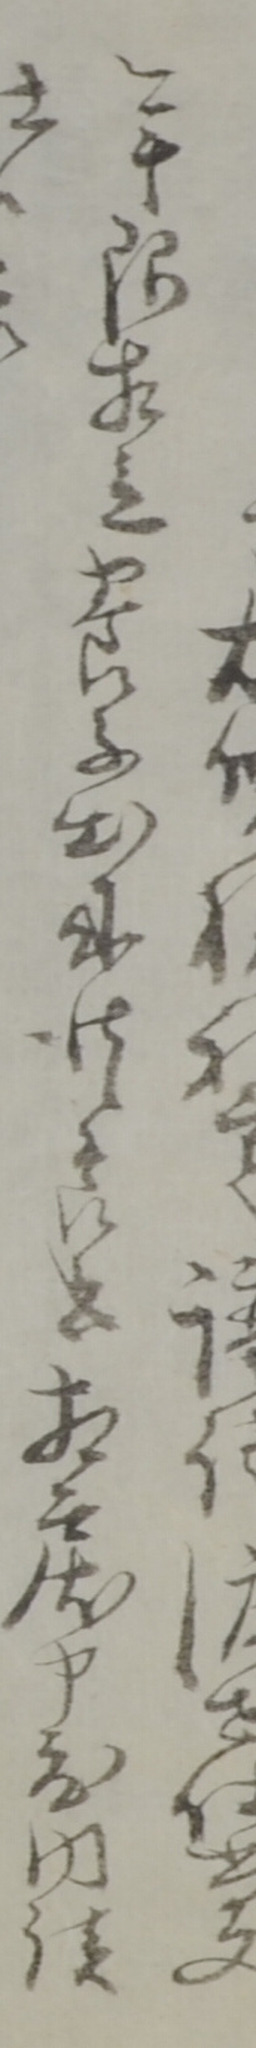年限相立養子出来仕候節者相戻申度内談
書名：諸願書控帳
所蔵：伊那市立高遠町図書館・合同会社AMANE
